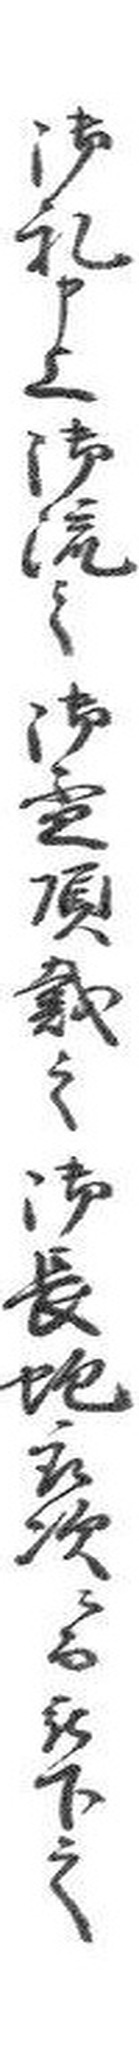御礼申上御流之御盃頂戴之御長蚫取次ニ而被下之
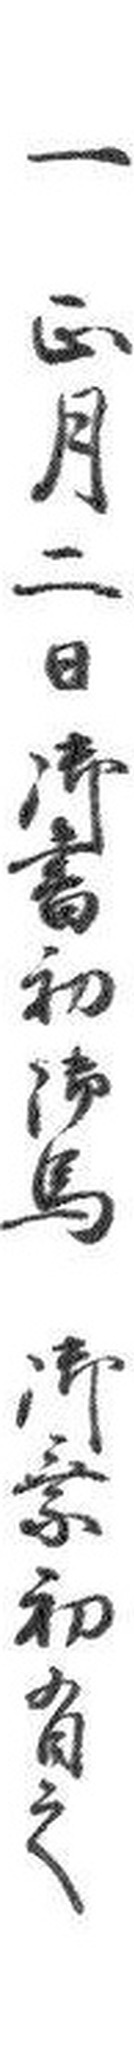一正月二日御書初御馬御乗初有之
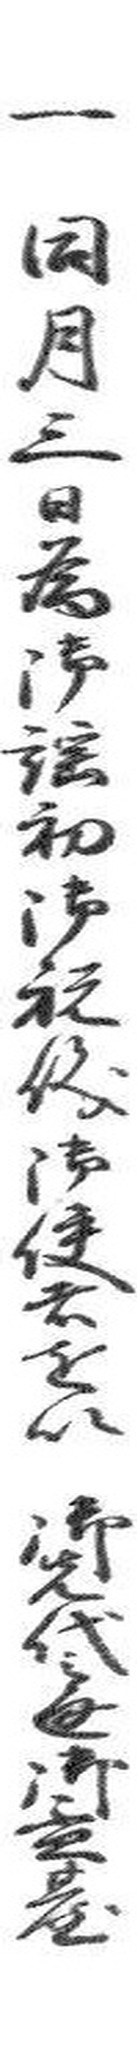一同月三日為御謡初御祝儀御使者を以御先代之通御盃台
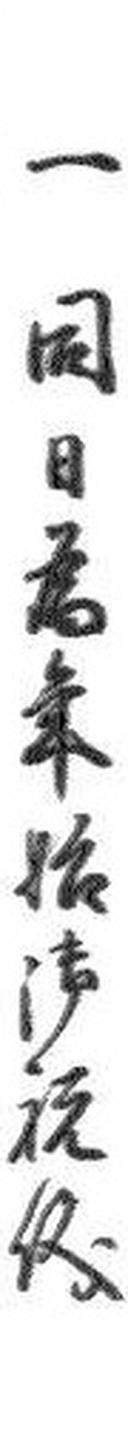一同日為年始御祝儀
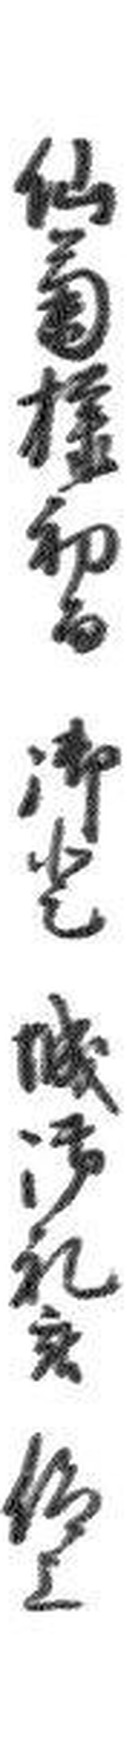仙菊様初而御登城御礼被仰上
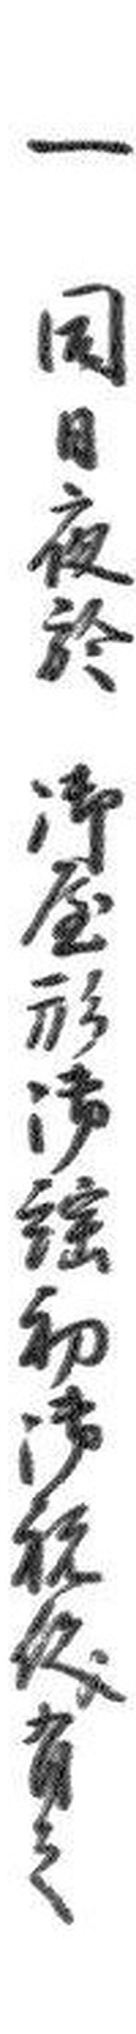一同日夜於御屋形御謡初御祝儀有之
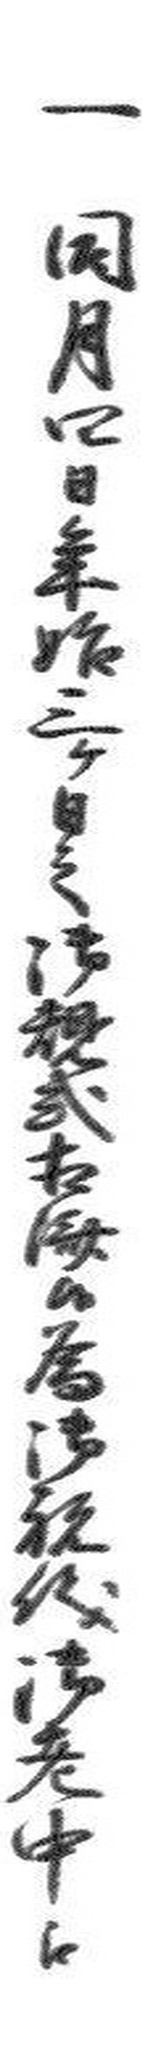一同月四日年始三ケ日之御規式相済候為御祝儀御老中江
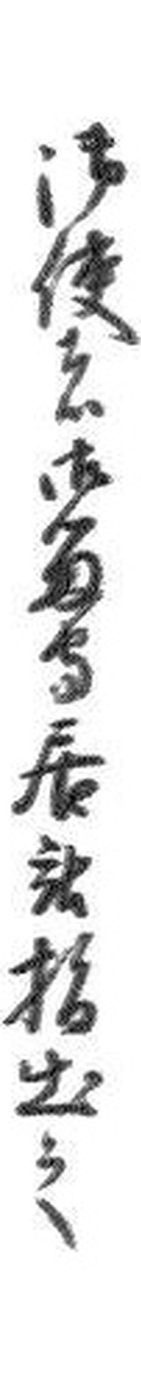御使者御留守居被指出之
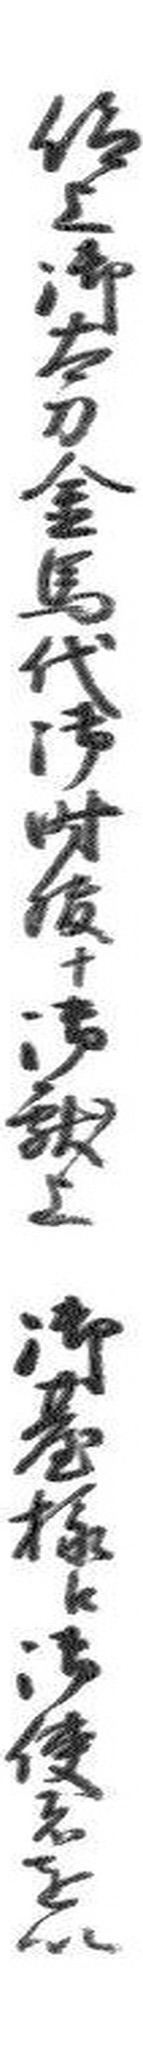仰上御太刀金馬代御時服十御献上御台様江御使者を以

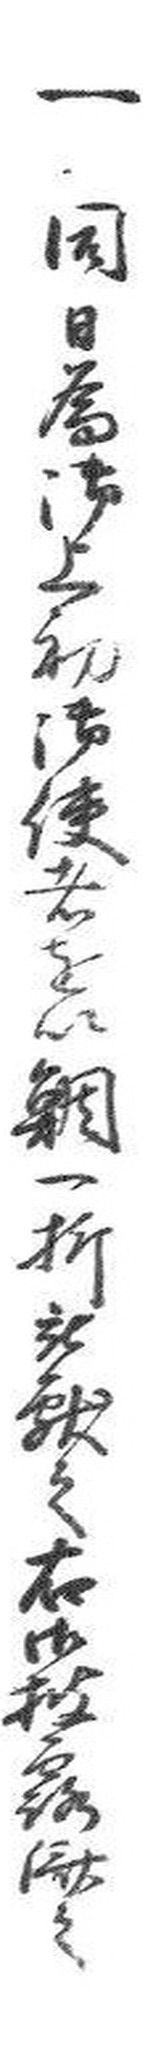一同日為御上初御使者を以鯛一折被献之右御披露済之
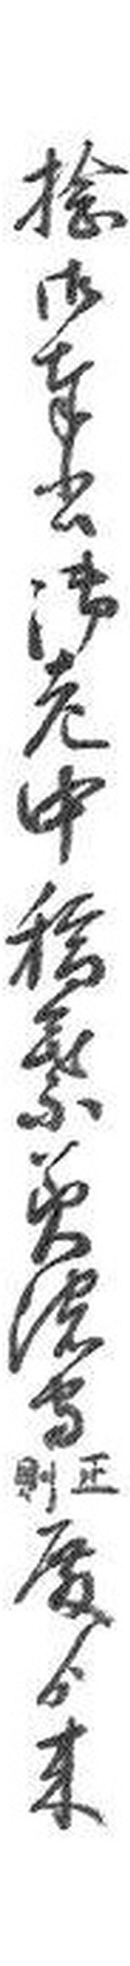捻御奉書御老中稲葉美濃守正則殿ゟ来
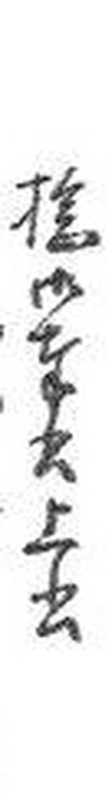捻御奉書上書
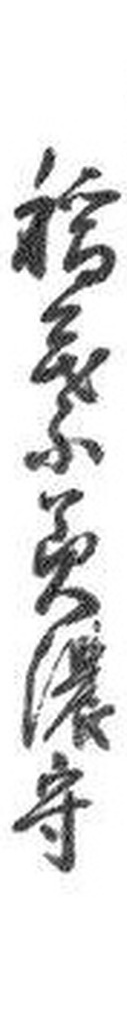稲葉美濃守
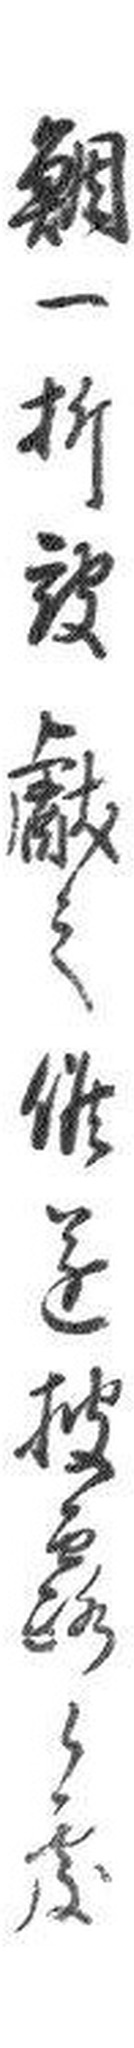鯛一折被献之候遂披露之処
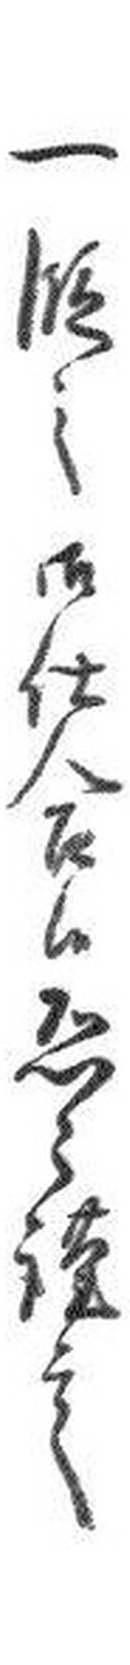一段之御仕合候恐々謹言
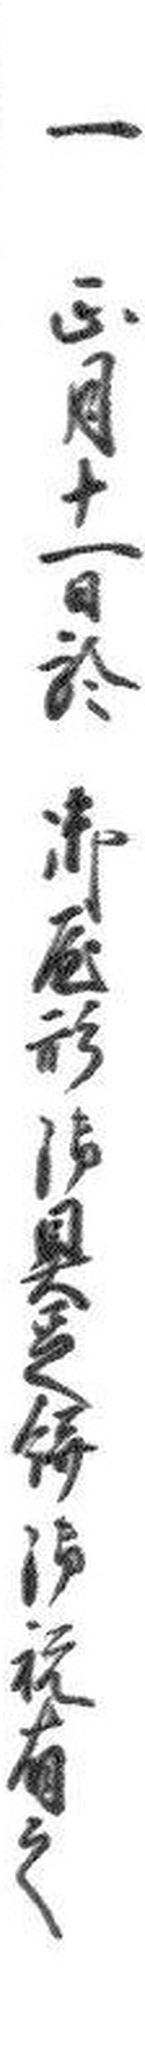正月十一日於御屋形御具足餅御祝有之
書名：家譜 十一 昌親公 従延宝二年到延宝四年八月
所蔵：福井県文書館 Fukui Prefectural Archives
